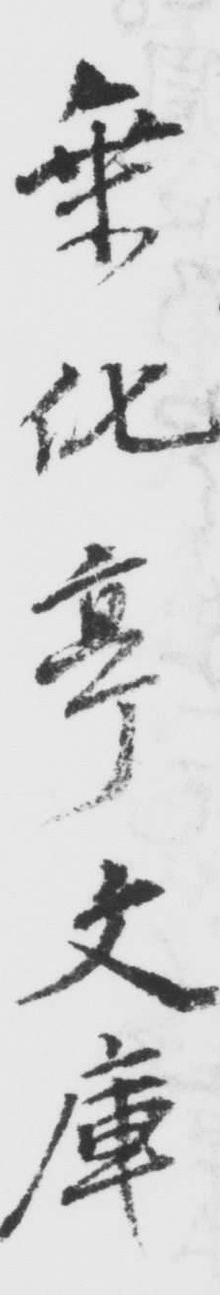乗化亭文庫
